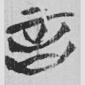言
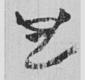也
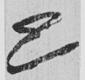已
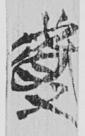○（且）
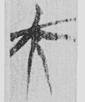夫
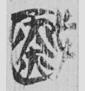{匚炎戈}
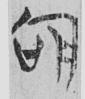含（今）
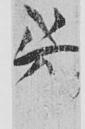人先
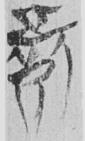○（喪）
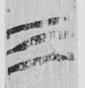三
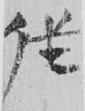代
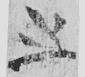之
